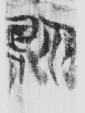則
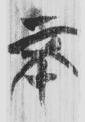不
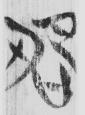卲
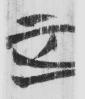正
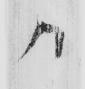人
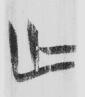亡
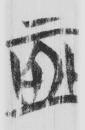亟
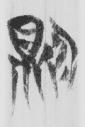則
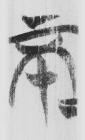不=
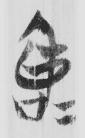口身=
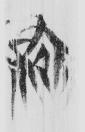則
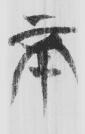不
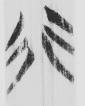行
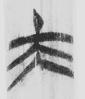夫
